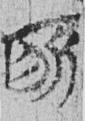所
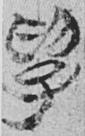○（學）
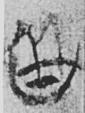皆
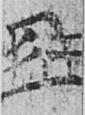○（崩）
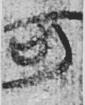可
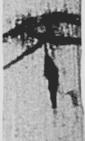不
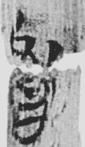○（慎）
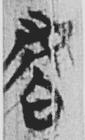○（乎）
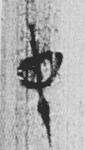中
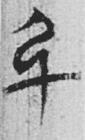弓
